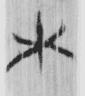木
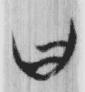曰
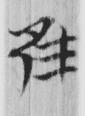隹
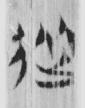從
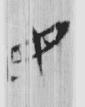母
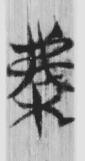柫
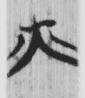火
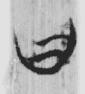曰
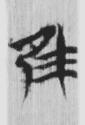隹
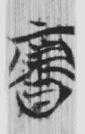啻
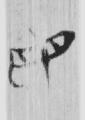母
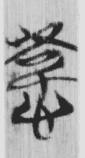{韋心}
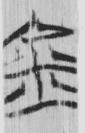金
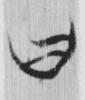曰
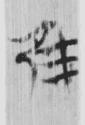隹
